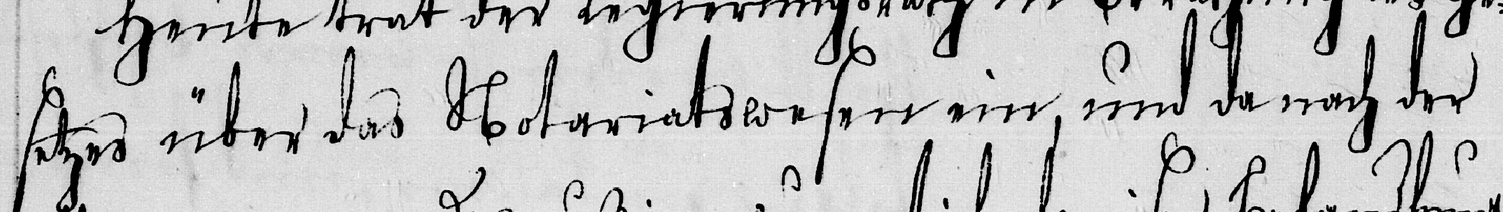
setzes über das Notariatswesen ein, und da nach der
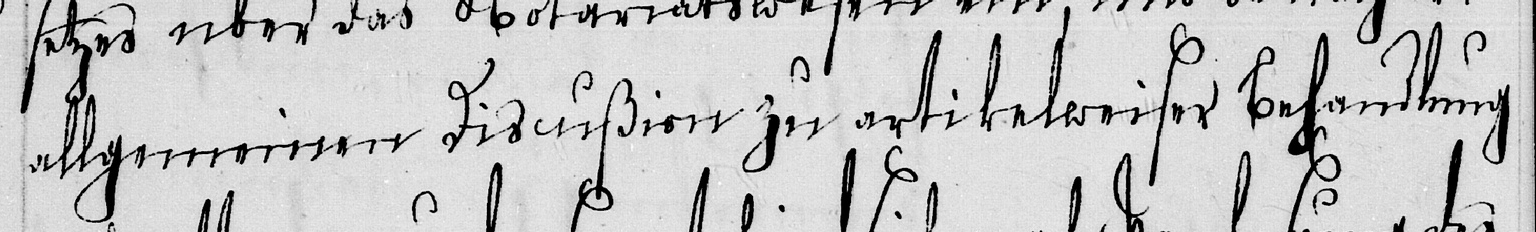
allgemeinen Discußion zu artikelweiser Behandlung
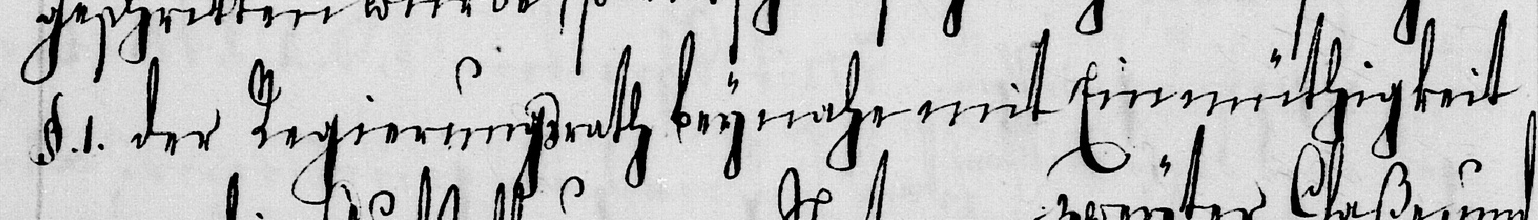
§.1. der Regierungsrath beynahe mit Einmündigkeit
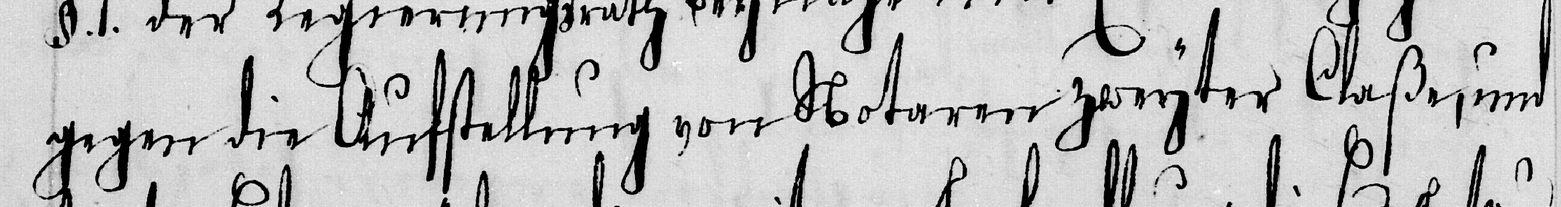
gegen die Aufstellung von Notaren zweyter Claße, und
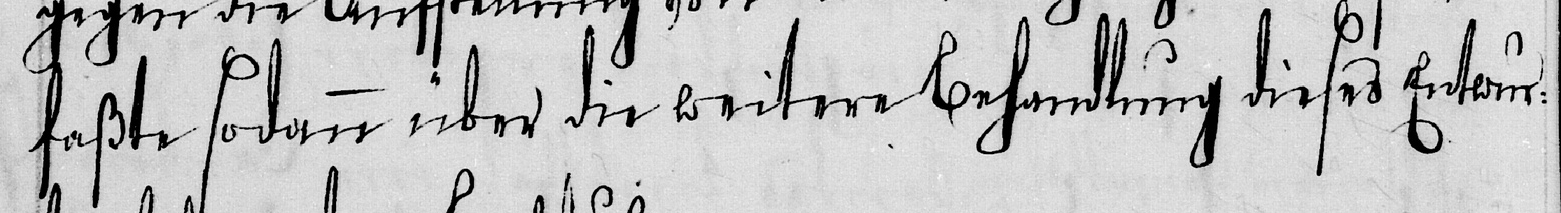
faßte sodann über die weitere Behandlung dieses Entwu¬
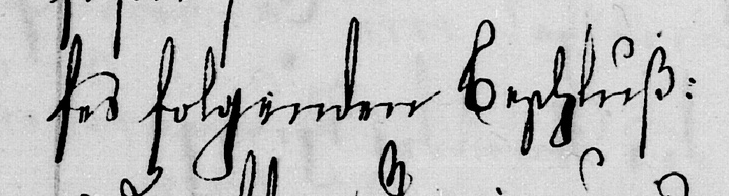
rfes folgenden Beschluß:
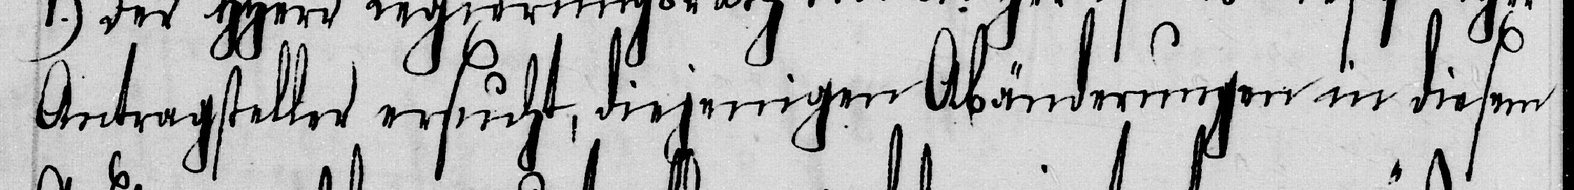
Antragsteller ersucht, diejenigen Abänderungen in diesem
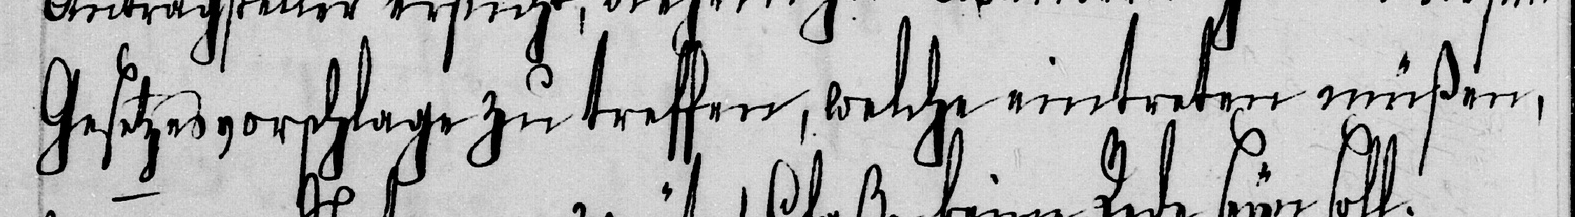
Gesetzesvorschlage zu treffen, welche eintreten müßen,
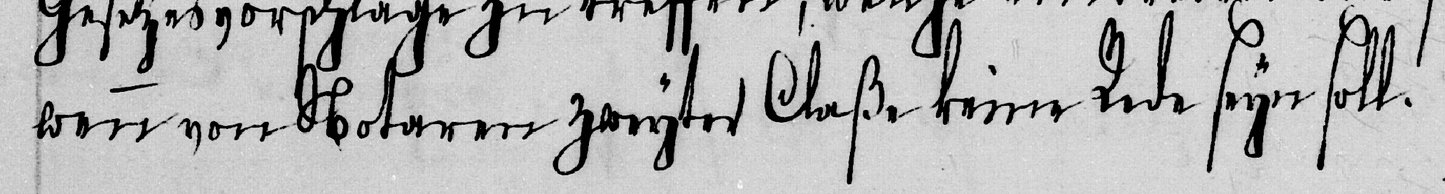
wenn von Notaren zweyter Claße keine Rede seyn soll.
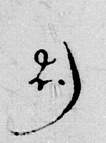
1.)
